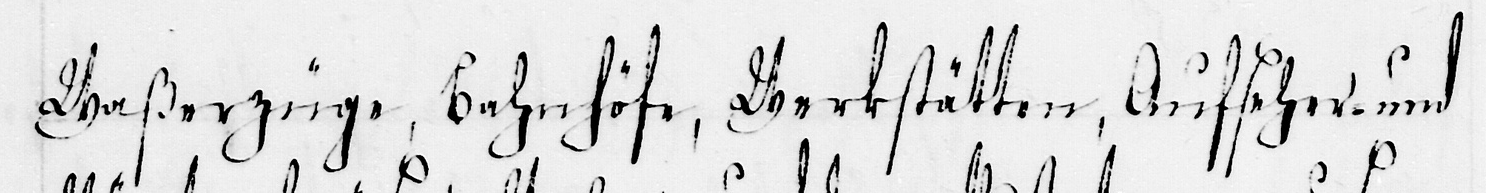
Waßerzüge, Bahnhöfe, Werkstätten, Aufseher- und
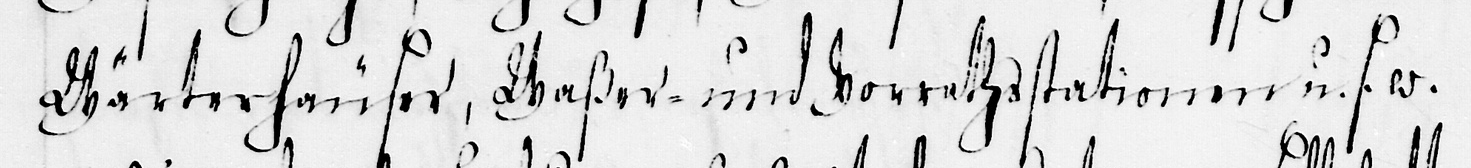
Wärterhäuser, Waßer- und Vorrathsstationen u. s.
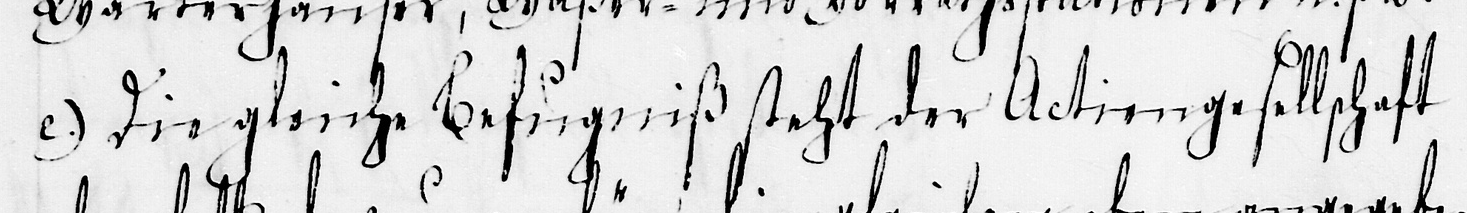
e.) Die gleiche Befugniß steht der Actiengesellschaft
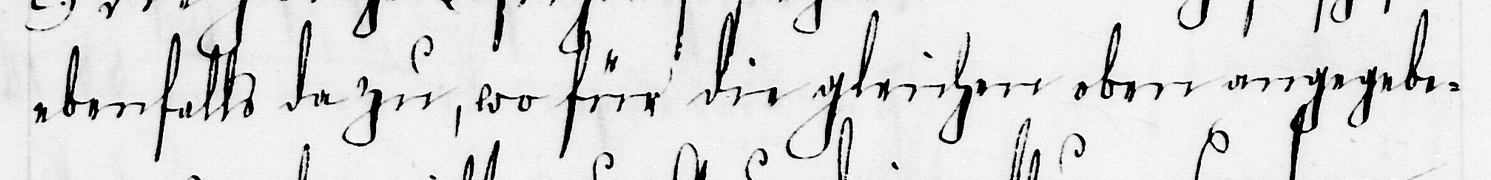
ebenfalls da zu, wo für die gleichen oben angegebe¬
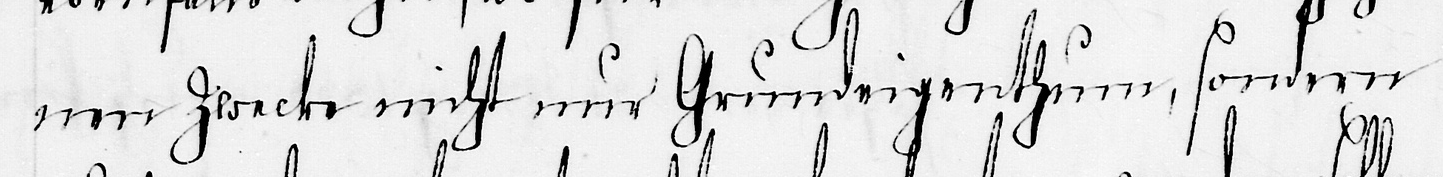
nen Zwecke nicht nur Grundeigenthum, sondern
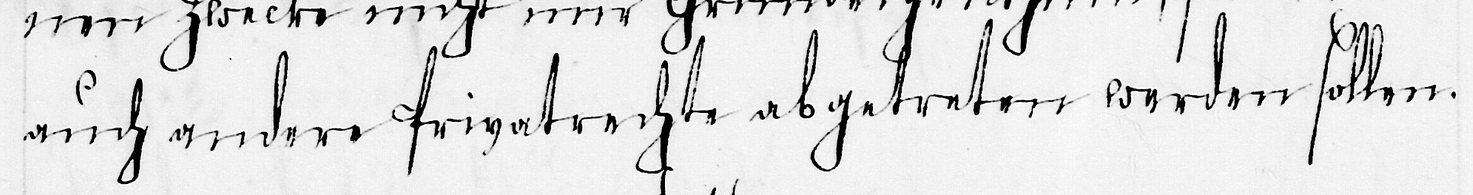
auch andere Privatrechte abgetreten werden sollen.
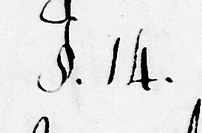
§. 14.
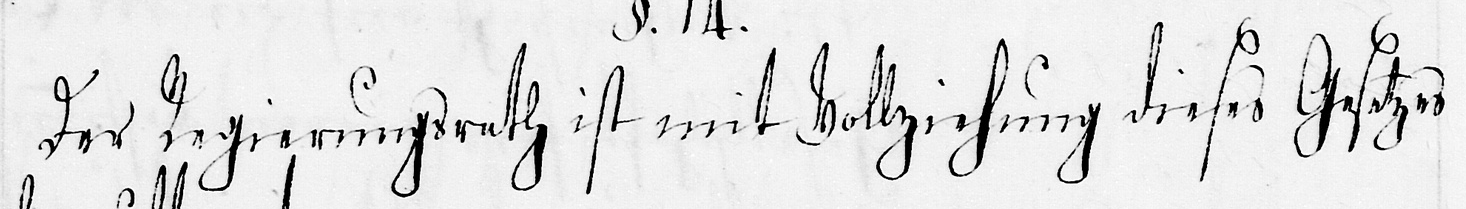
Der Regierungsrath ist mit Vollziehung dieses Gesetzes
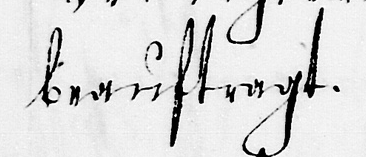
beauftragt.
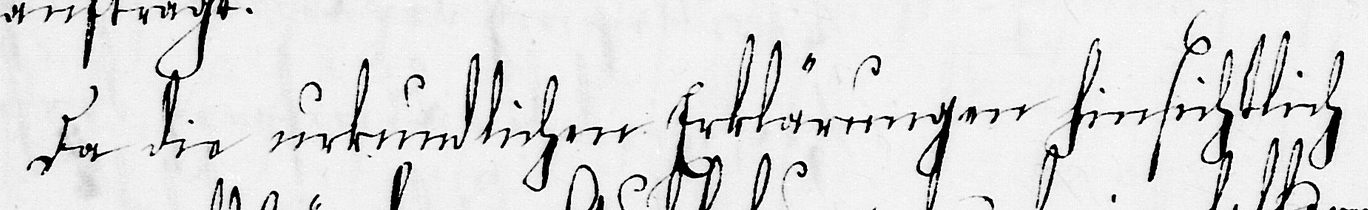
Da die urkundlichen Erklärungen hinsichtlich
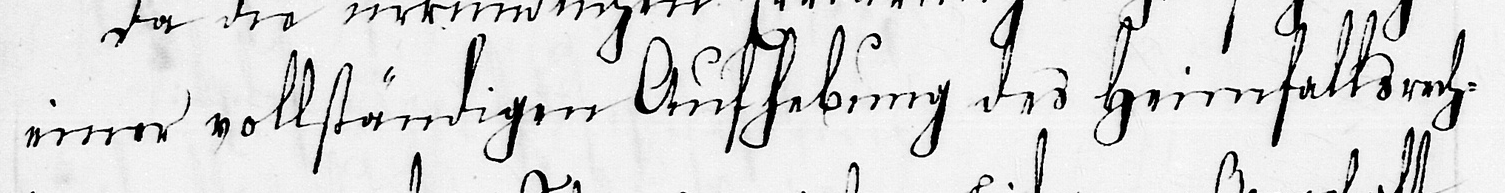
einer vollständigen Aufhebung des Heimfallsrech¬
